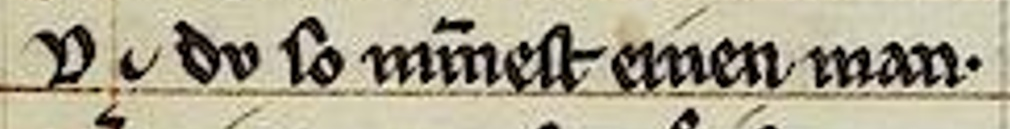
D(az) dv ſo mi(n)neſt einen man.
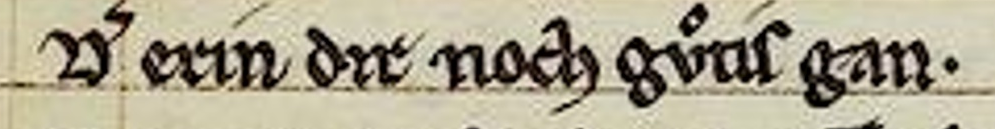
D(er) erin dir noch gv°otiſ gan.
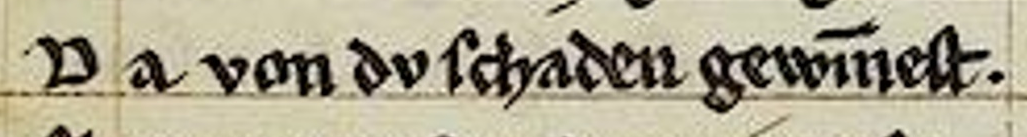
Da von dv ſchaden gewi(n)neſt.
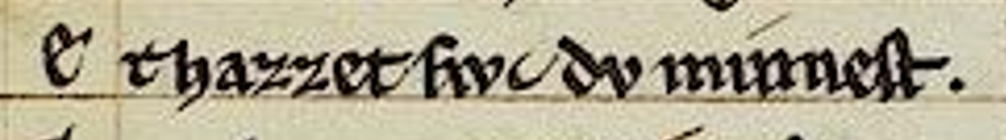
Er hazzet ſw(az) dv minneſt.
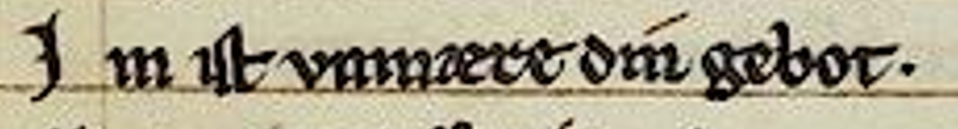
Im iſt vnm[ae]re din gebot.
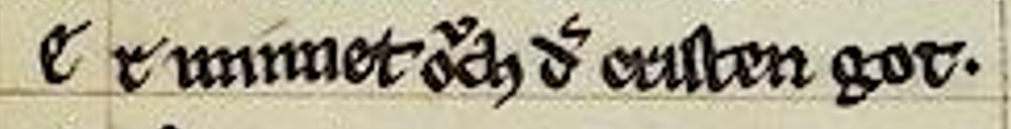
Er minnet o°vch d(er) criſten got.
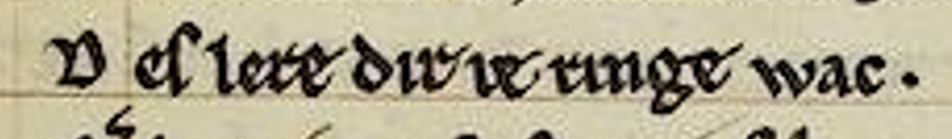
Deſ lere dir ie ringe wac.
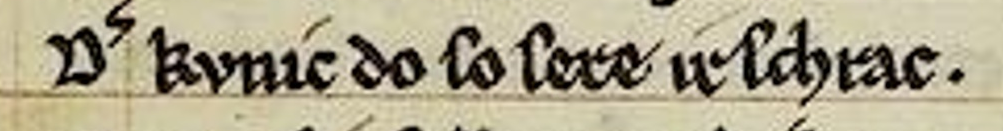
D(er) kvnic do ſo ſere irſchrac.
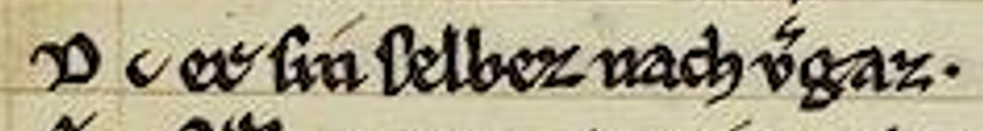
D(az) er ſin ſelbez nach v(er)gaz.
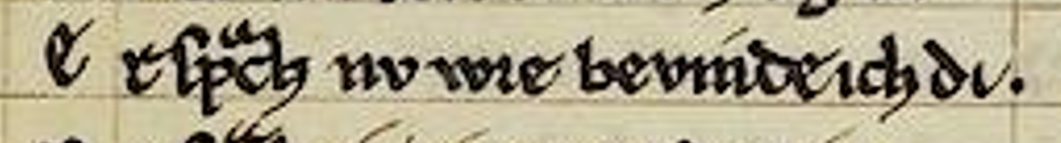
Er ſp(ra)ch nv wie bevinde ich d(az).
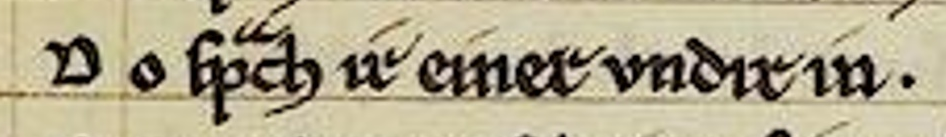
Do ſp(ra)ch ir einer vndir in.
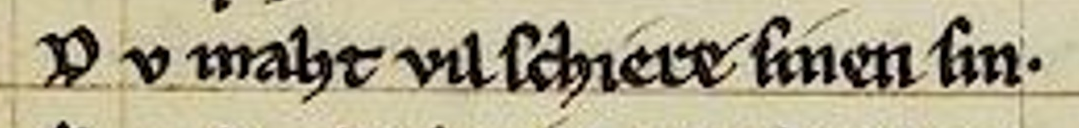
Dv maht vil ſchiere ſinen ſin.
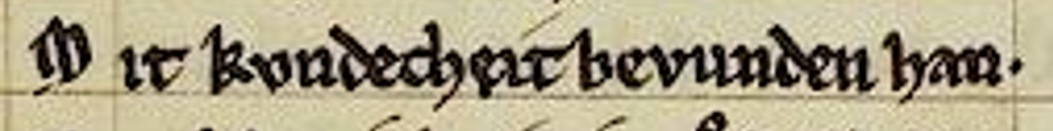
Mit kvndecheit bevunden han.
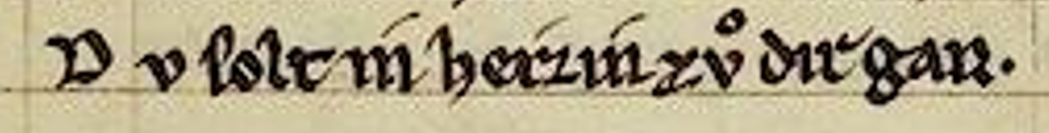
Dv ſolt in heizin zv°o dir gan.
